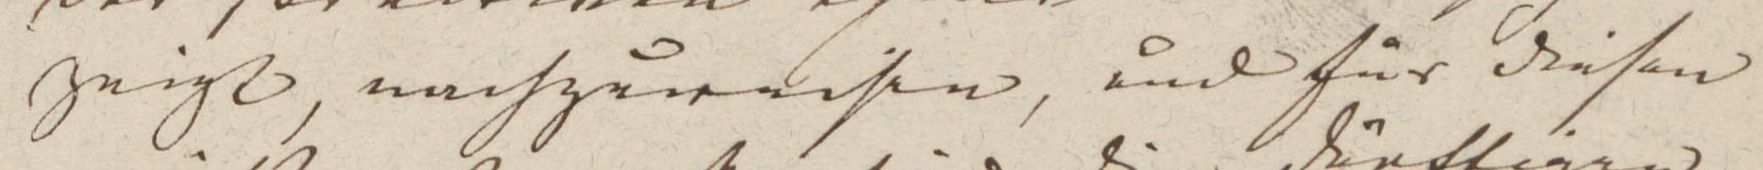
zeigt, nachzuweisen, und für diesen
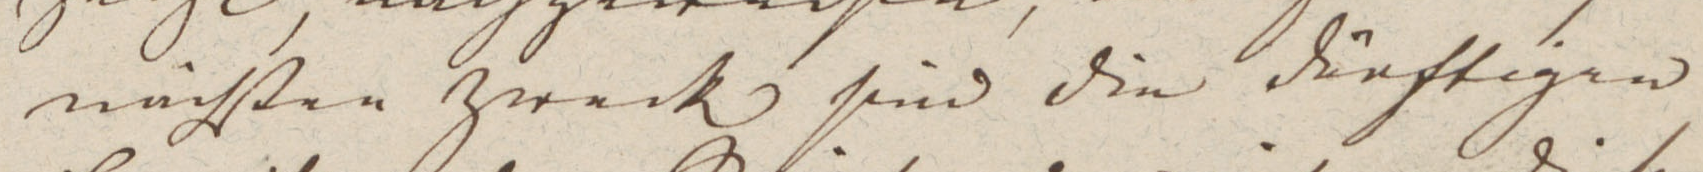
nächsten Zweck sind die dürftigen
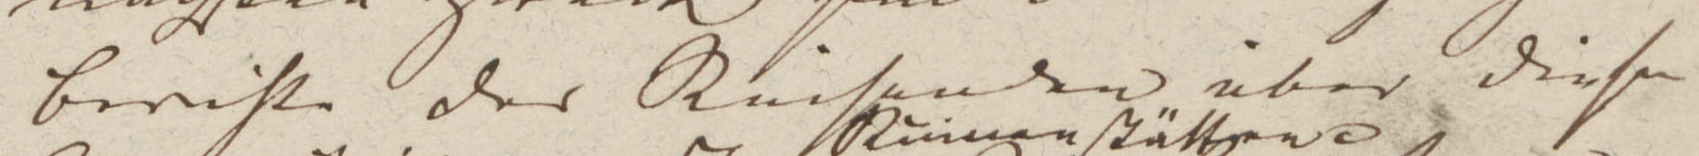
Berichte der Reisenden über diese
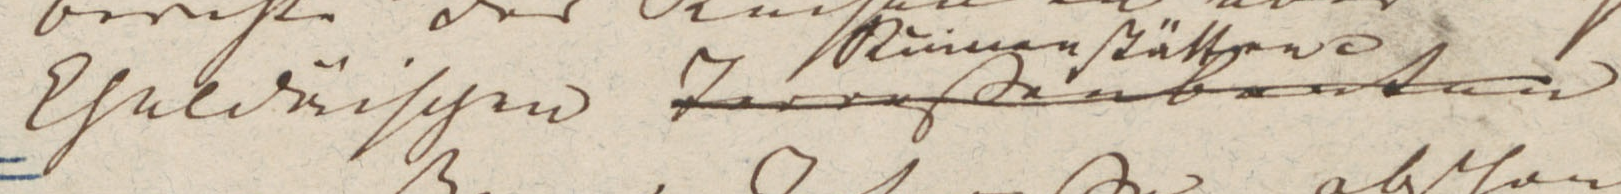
Chaldäischen Terrassenbauten
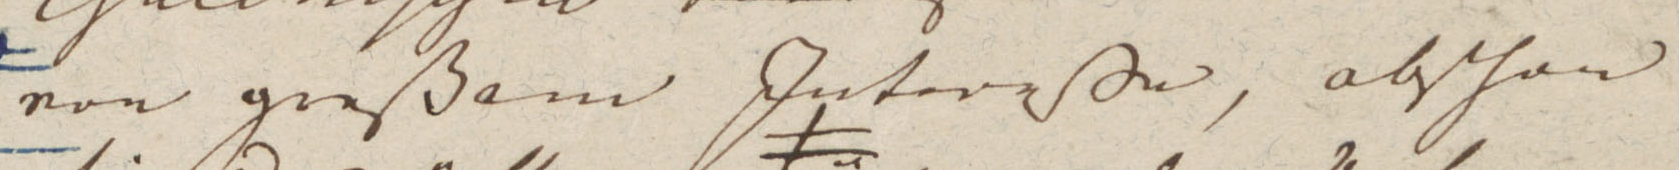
von grossem Interesse, obschon
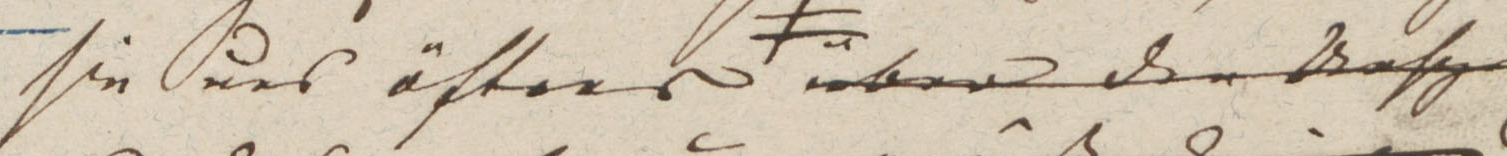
sie uns öfters über den Ursrpung %
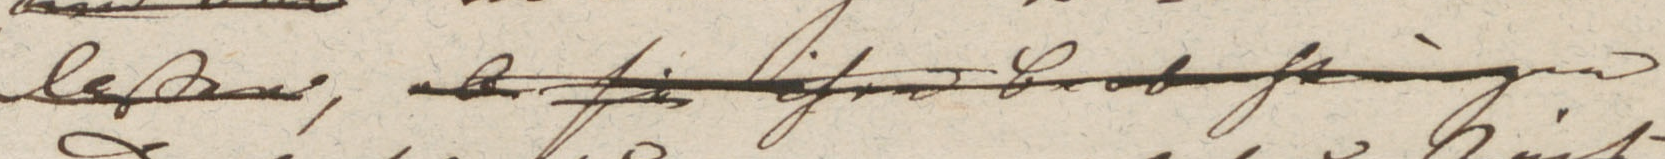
lassen, ob s ihre Beobachtungen
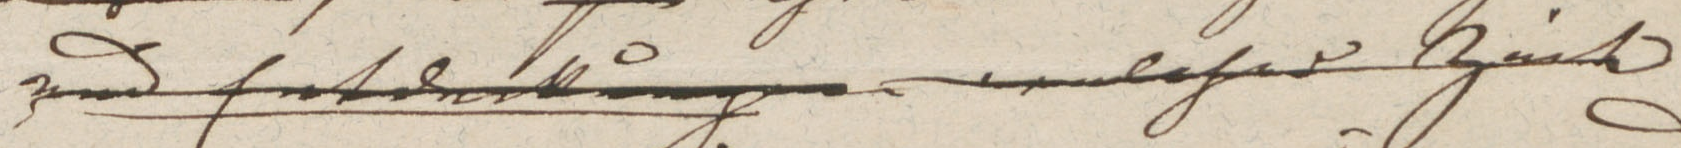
und Entdeckungen welcher Zeit
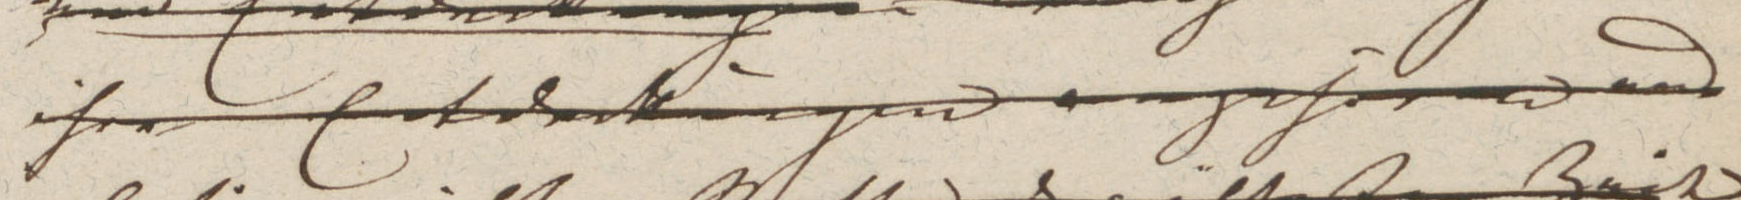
ihre Entdeckungen angehören und
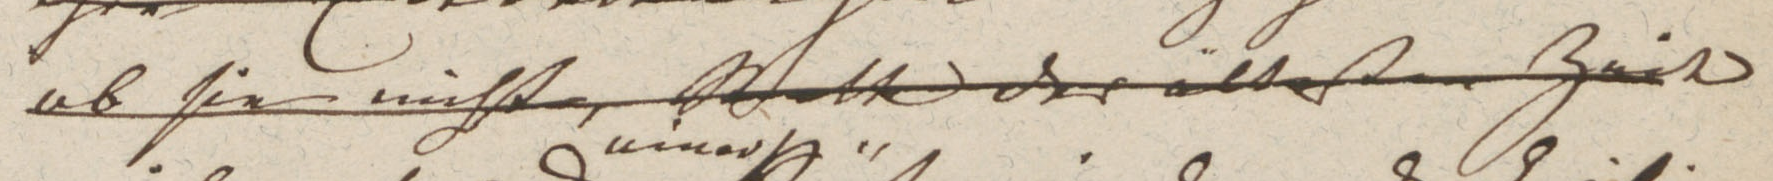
ob sie nicht, Statt der ältesten Zeit
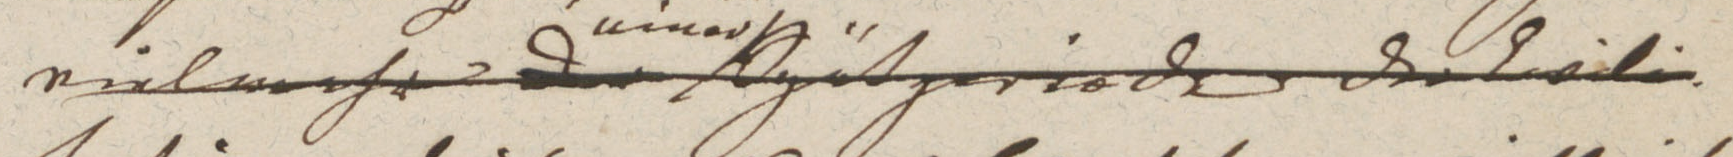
vielmehr der einer Spätperiode der Civili
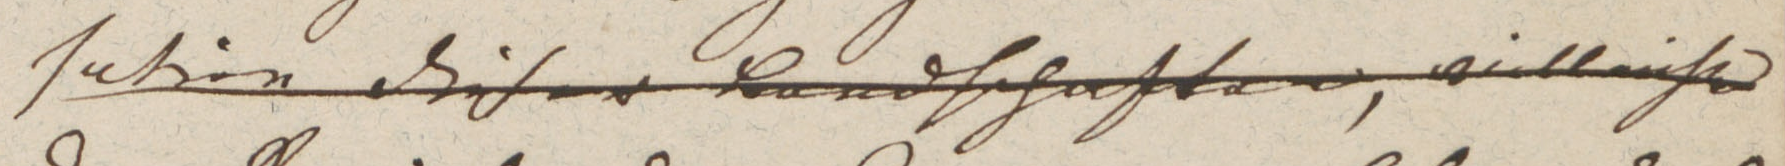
sation dieser Landschaften, vielleicht
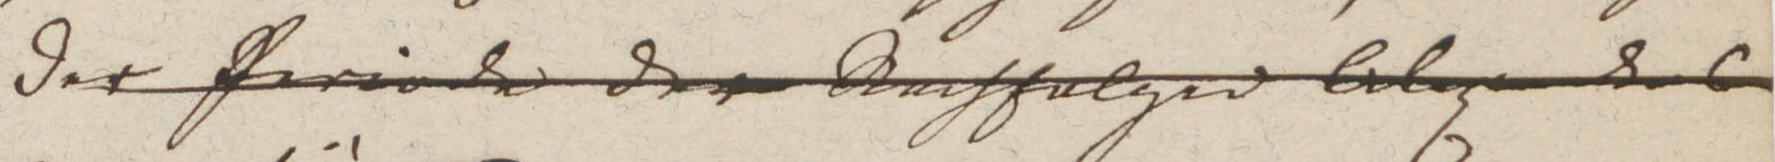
der Periode der Nachfolger Alexanders
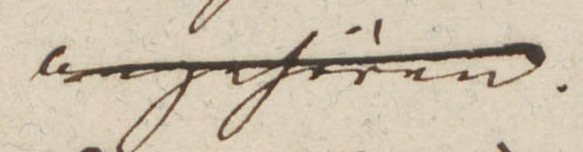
angehören.
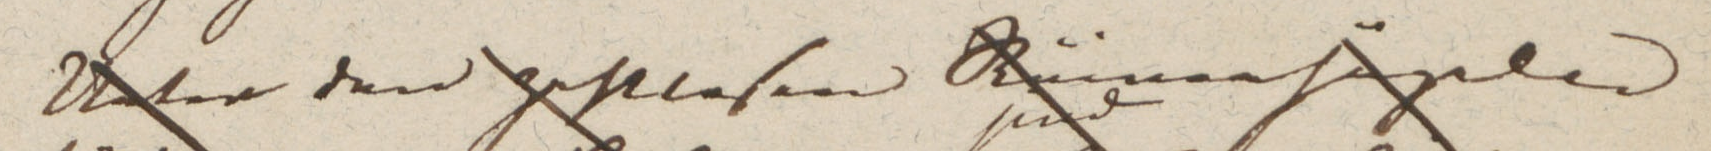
Ueber den zahllosen Ruinenhügeln
